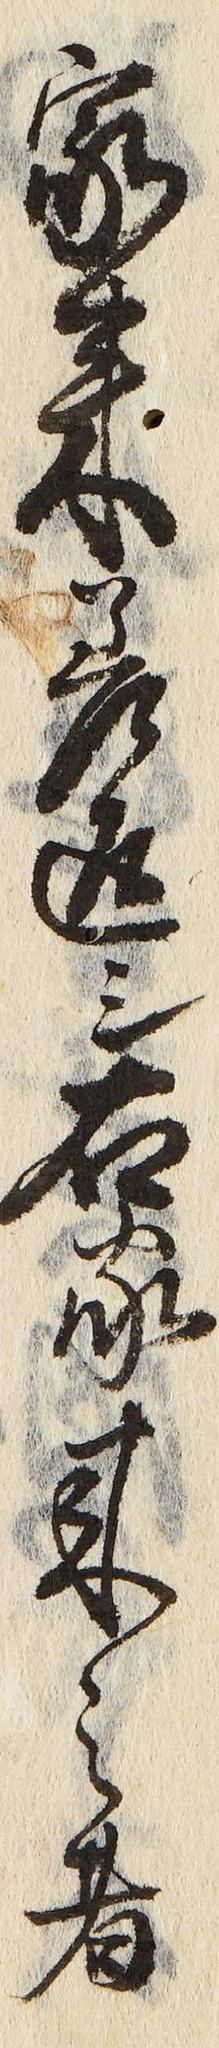家来差返シ右家来之者
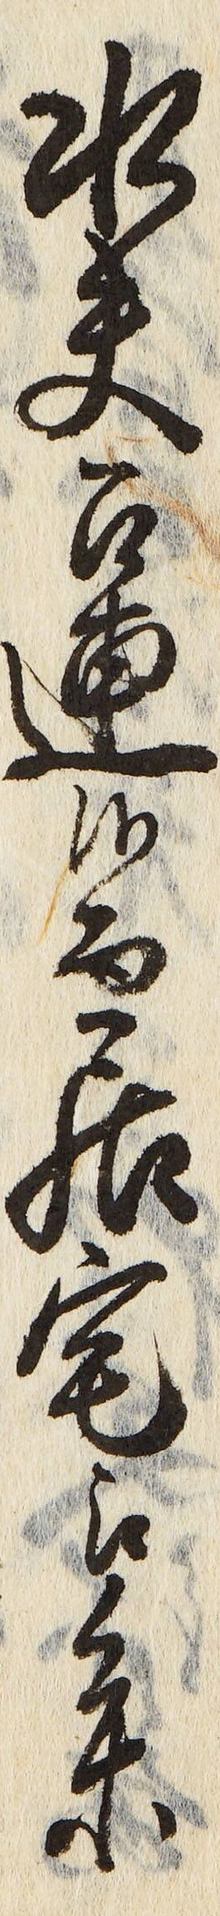水夫召連候而居宅江参
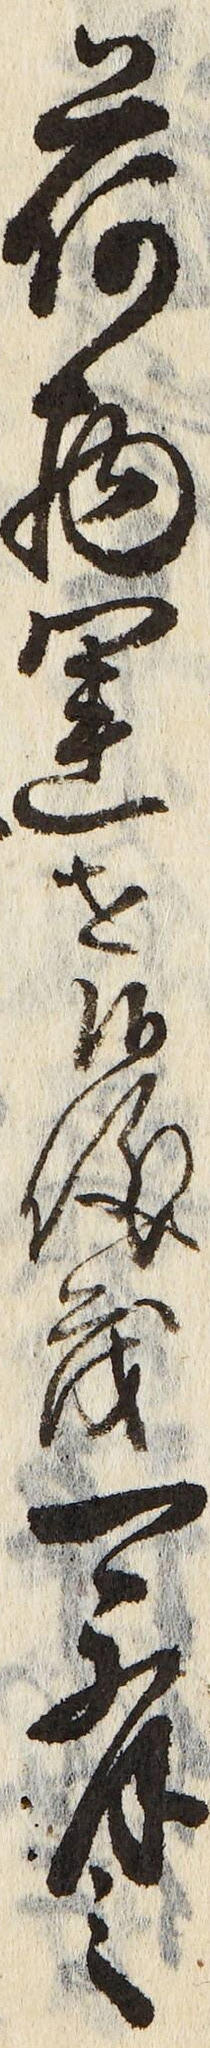荷物運せ候儀も可有之
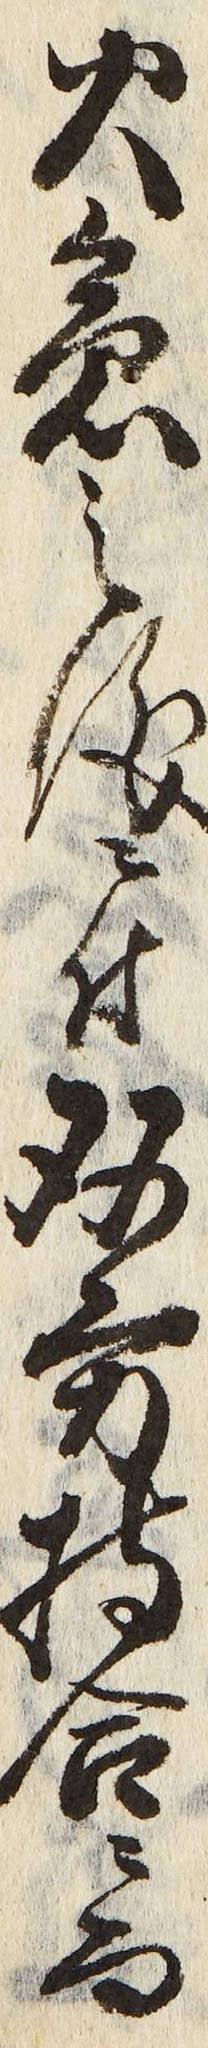火急之儀ニ付双方持合ニ而
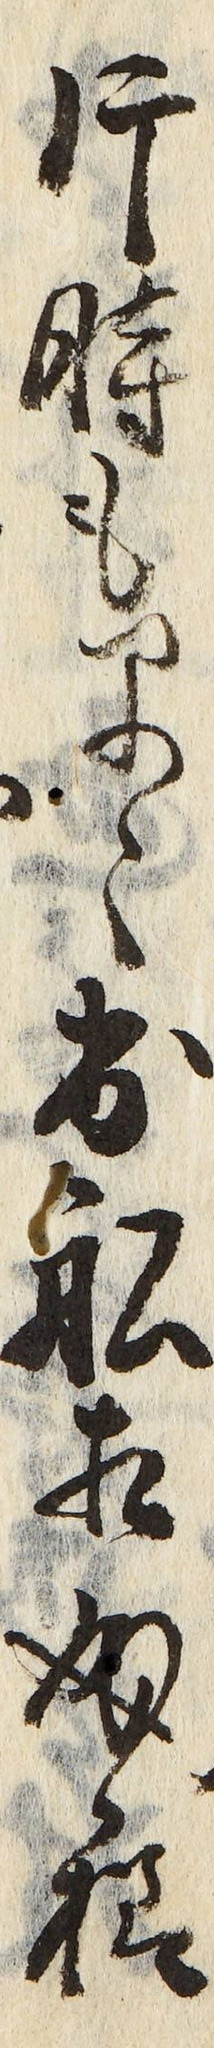片時も早々出船相成候様
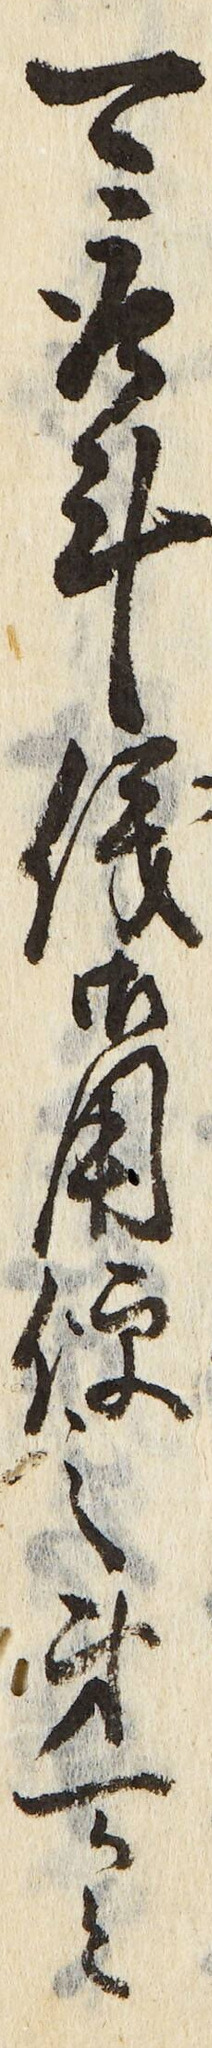可取計儀御用便之第一々々
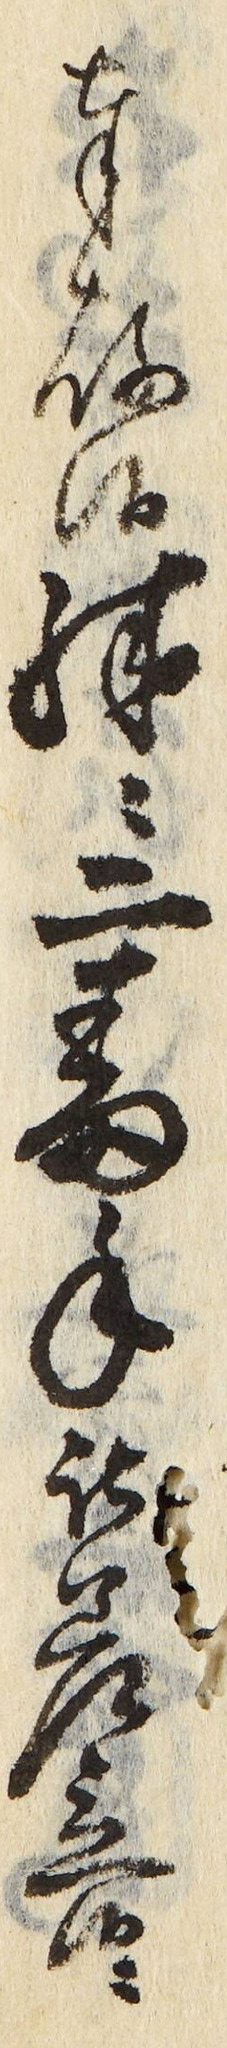奉存候殊ニ二番手被差立候ニ

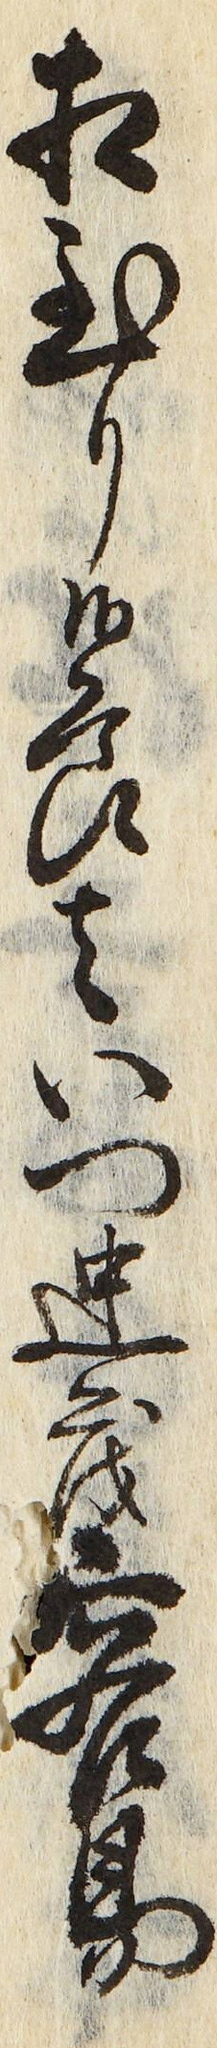相至り候節者いつ迚も容易
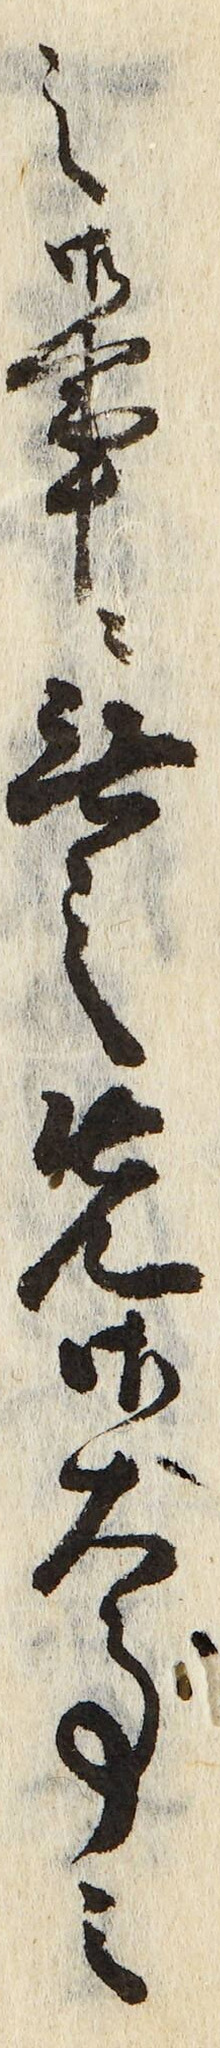之御事ニ無之先御大事之
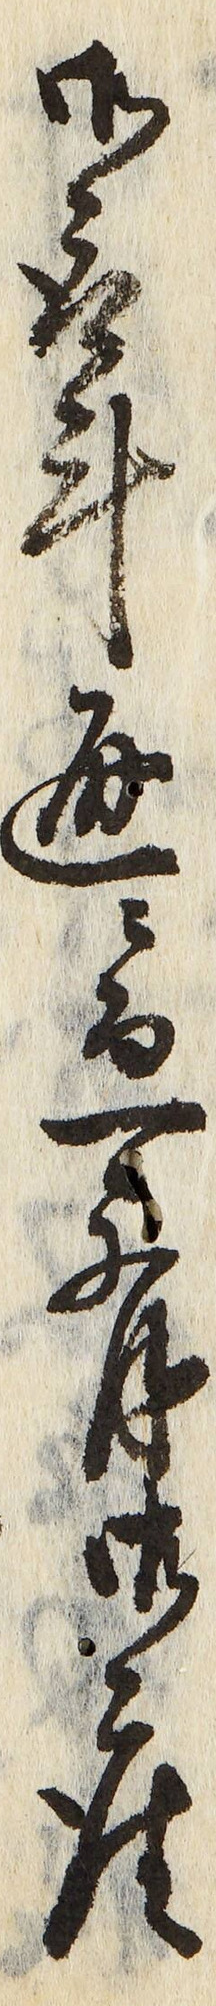御取計通ニ而可有御座
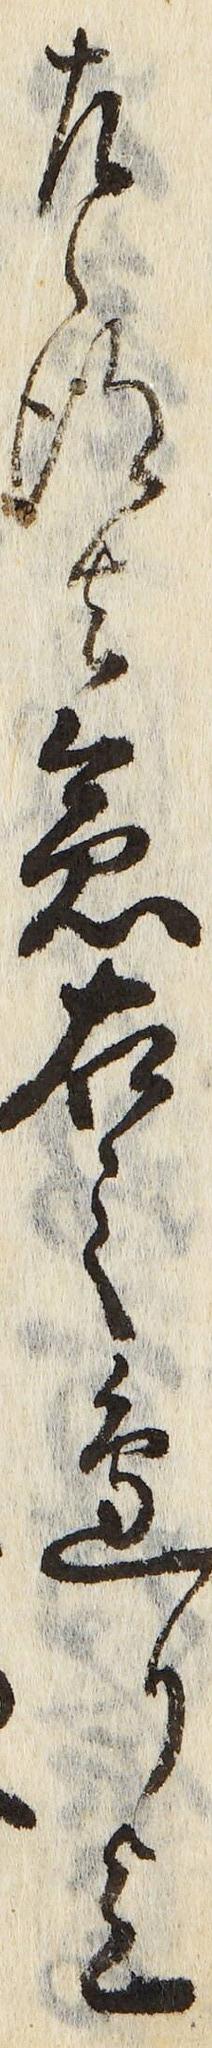左候得者急右之辺り迄
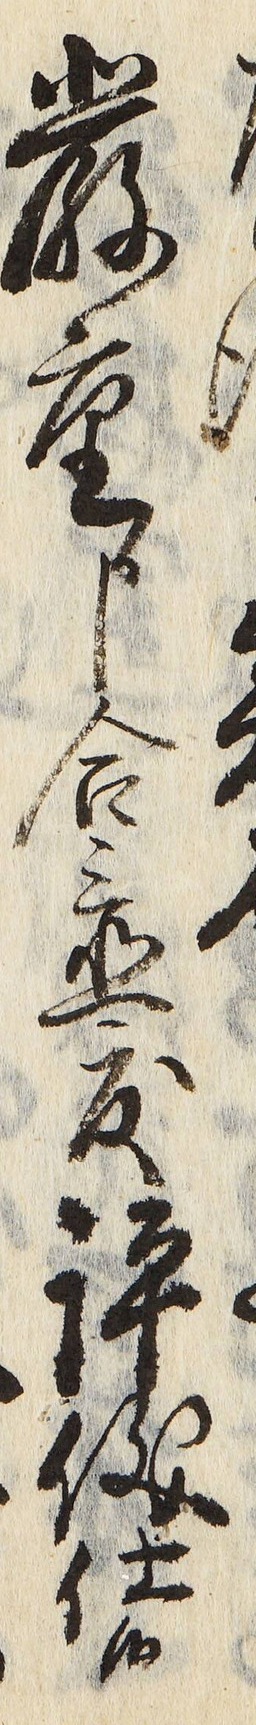厳重申合置度評儀仕候
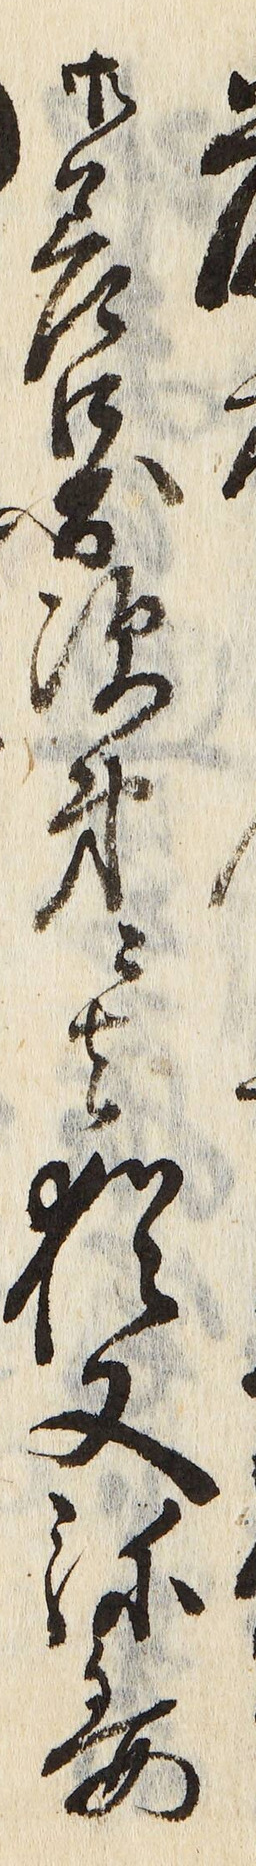御差図次第ニ者猶又弥委
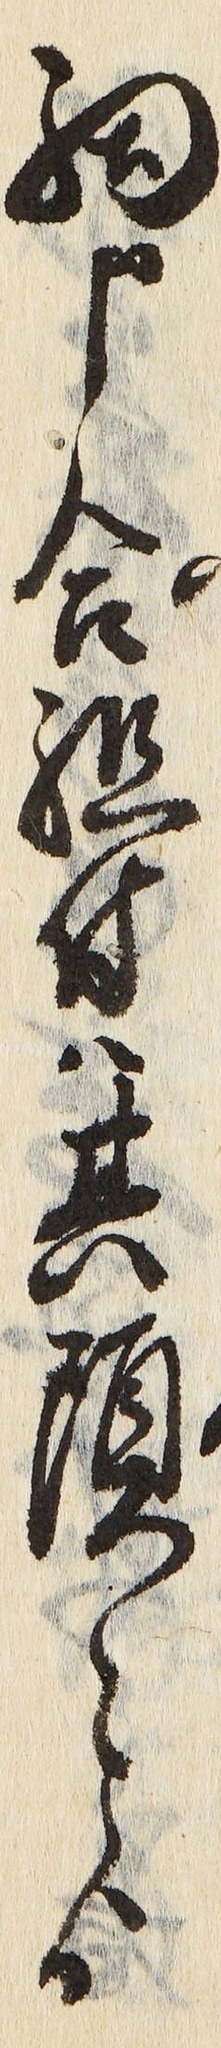細申合組付ハ其頭々ゟ
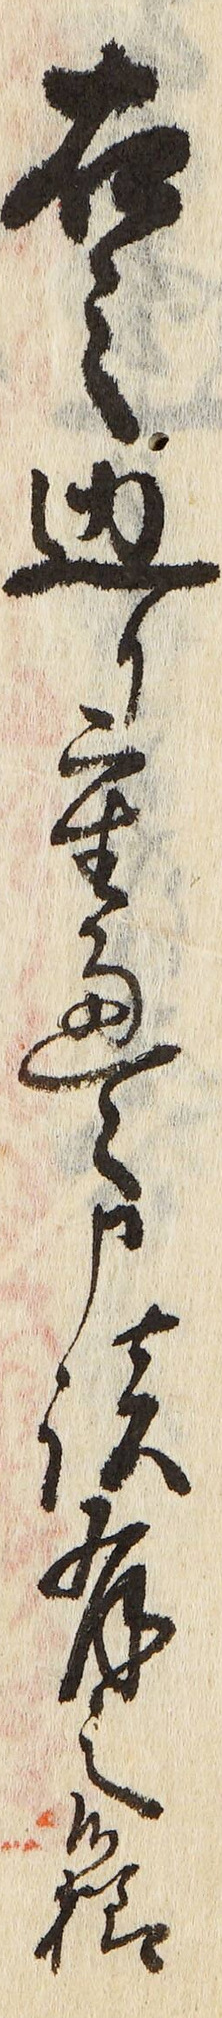右之辺り重畳申談有之候様
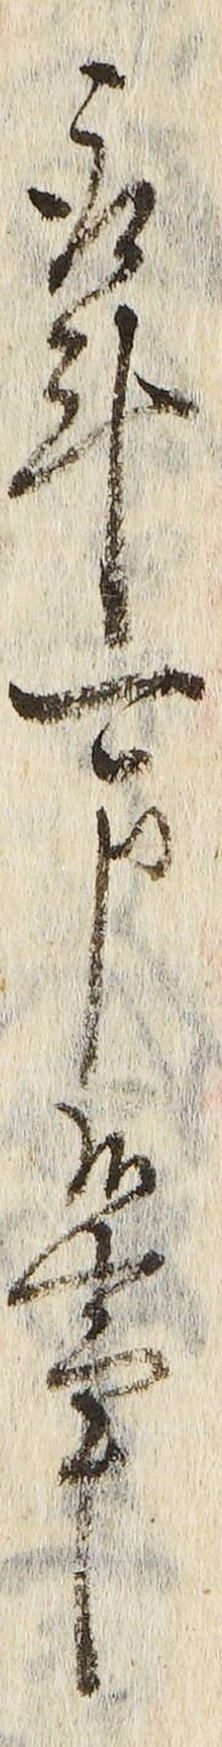取計可申候事
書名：御領海江異国船漂流有之節御手当之次第大組頭心得之廉々書集記
